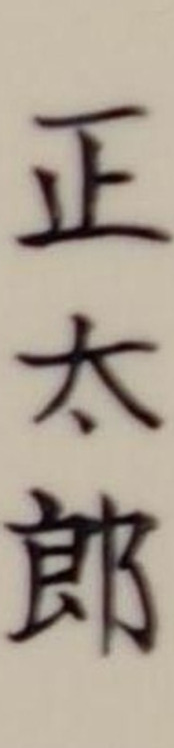正太郎
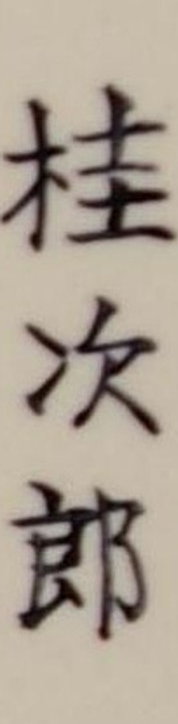桂次郎
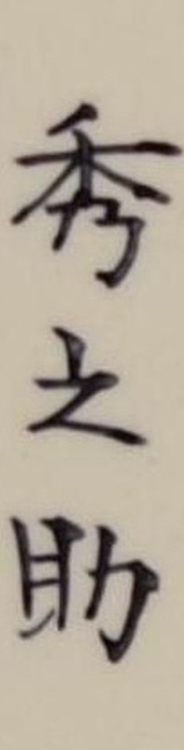秀之助
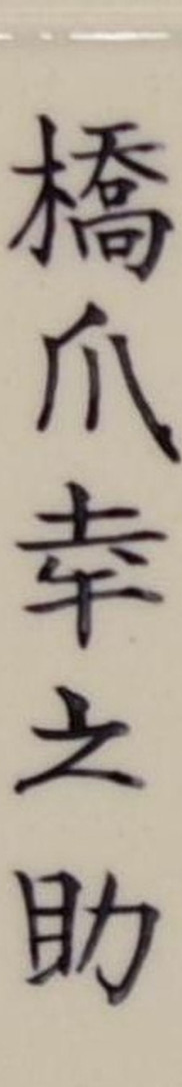橋瓜幸之助
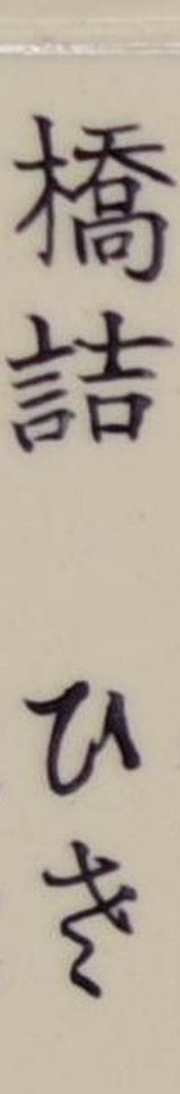橋詰ひさ
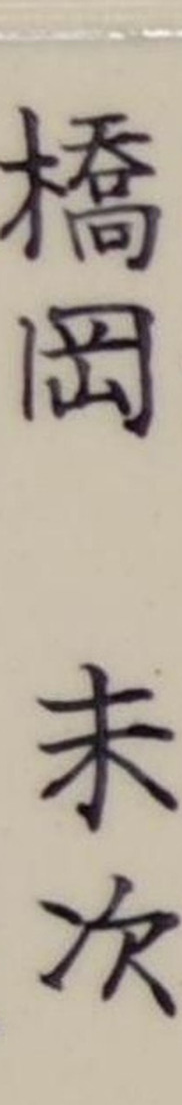橋岡未次
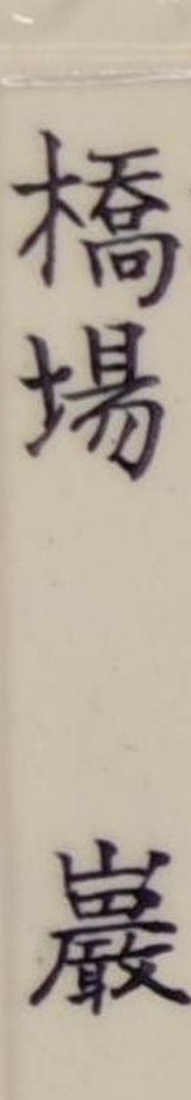橋場巌

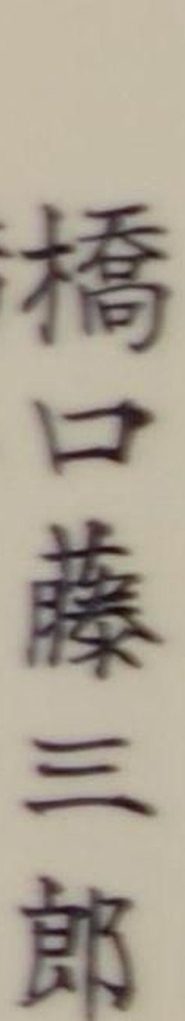橋口藤三郎
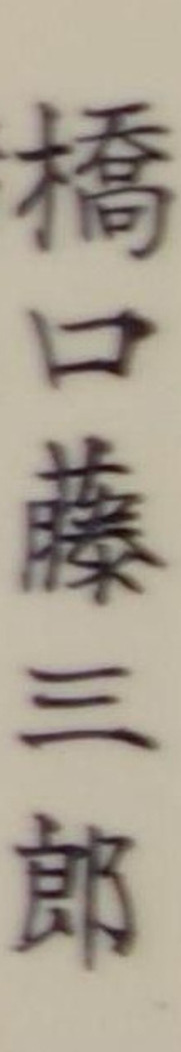橋口藤三郎
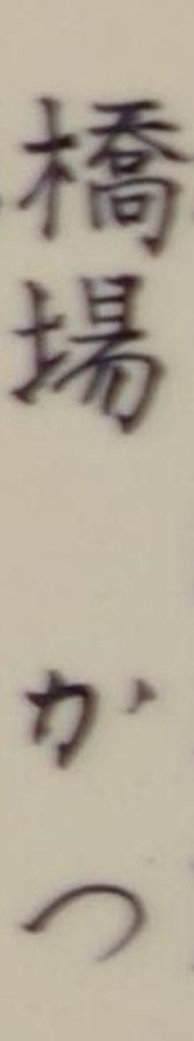橋場かつ
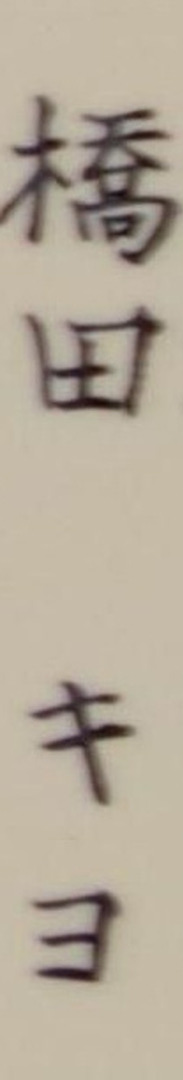橋田キヨ
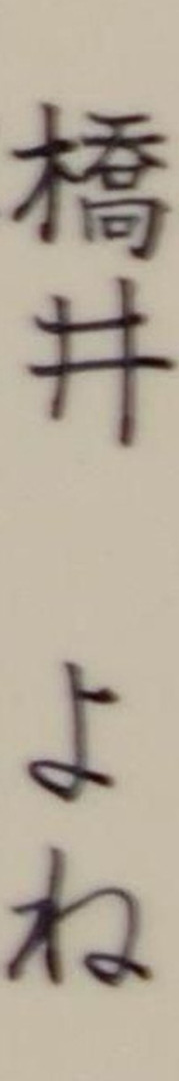橋井よね
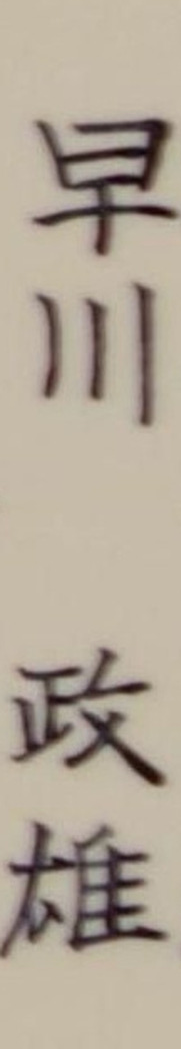早川政雄
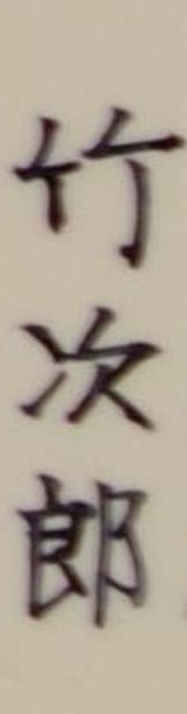竹次郎
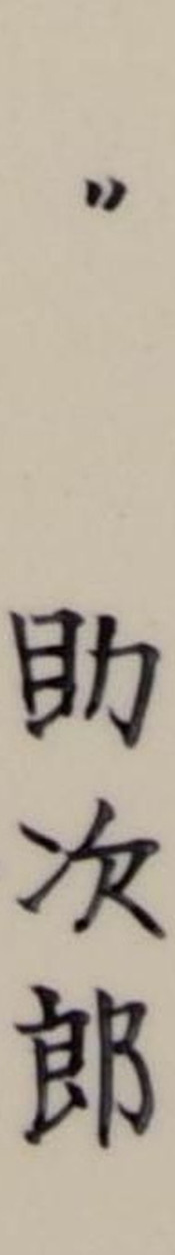助次郎
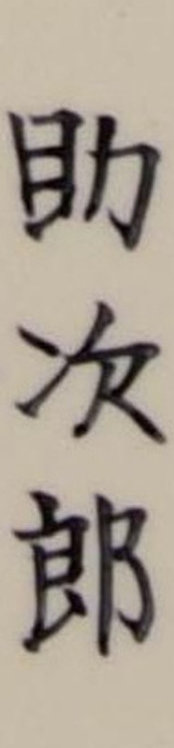助次郎
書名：M~S
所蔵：高野山金剛峯寺
